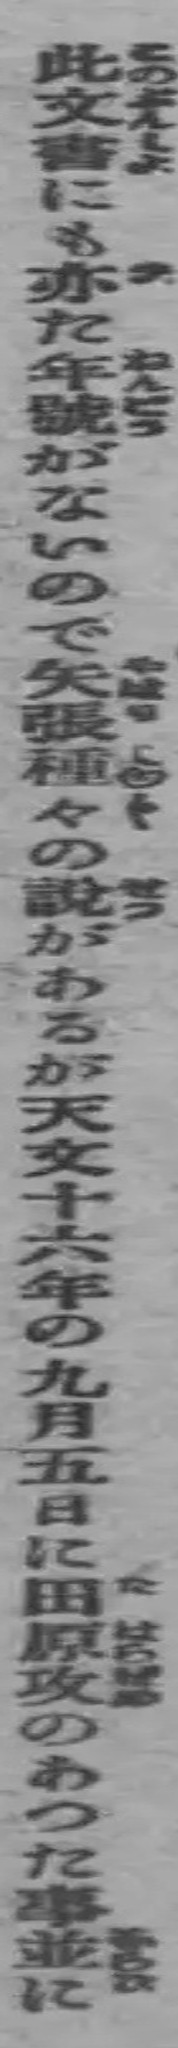此文書にも亦た年号がないので矢張種々の説があるが天文十六年の九月五日に田原攻のあつた事並に
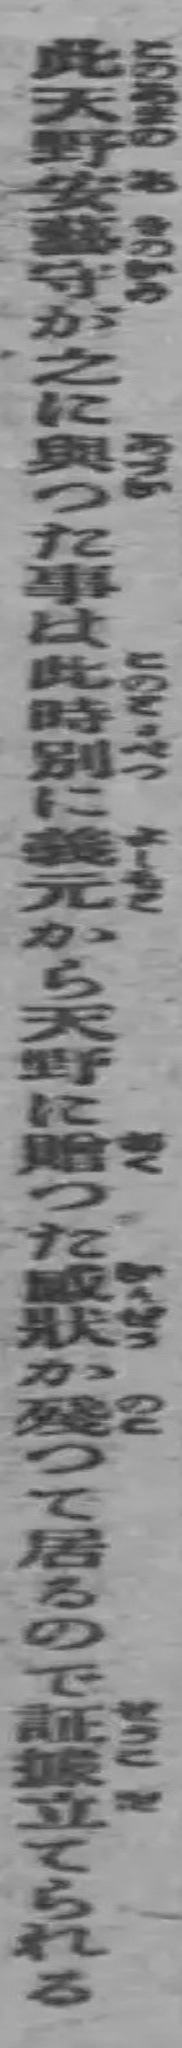此天野安芸守が之に与つた事は此時別に義元から天野に贈つた感状か残つて居るので証拠立てられる
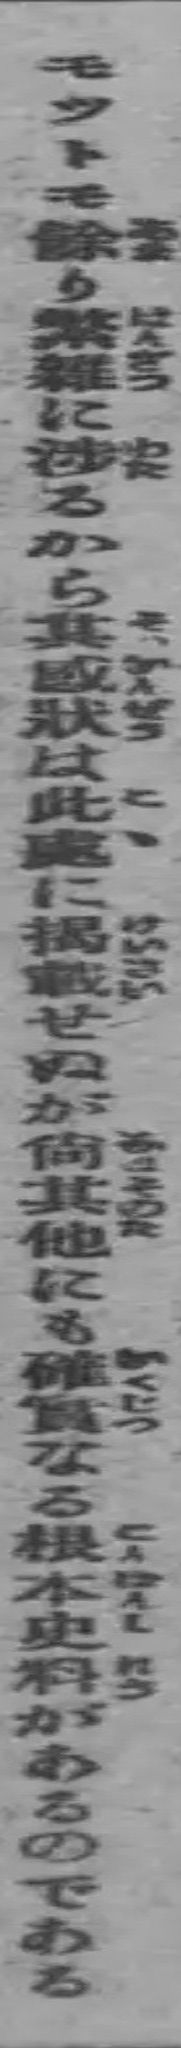モツトモ余り繁雑に渉るから其感状は此処に掲載せぬが尚其他にも確実なる根本史料があるのである

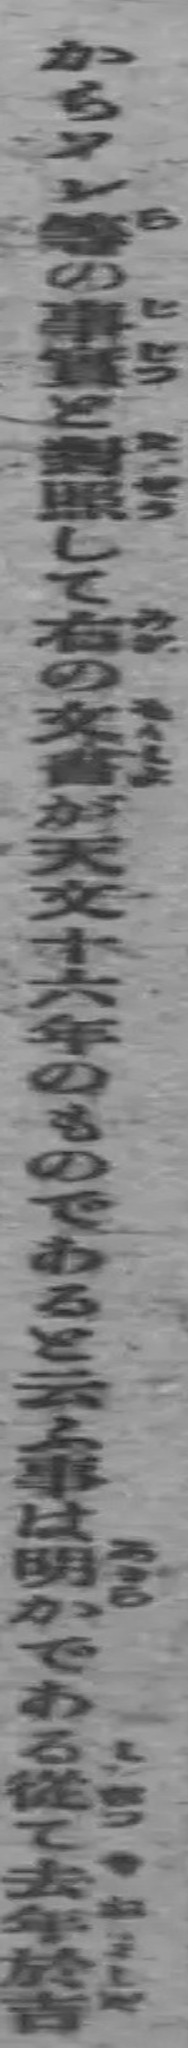からソレ等の事実と対照して右の文書が天文十六年のものであると云ふ事は明かである従て去年於吉
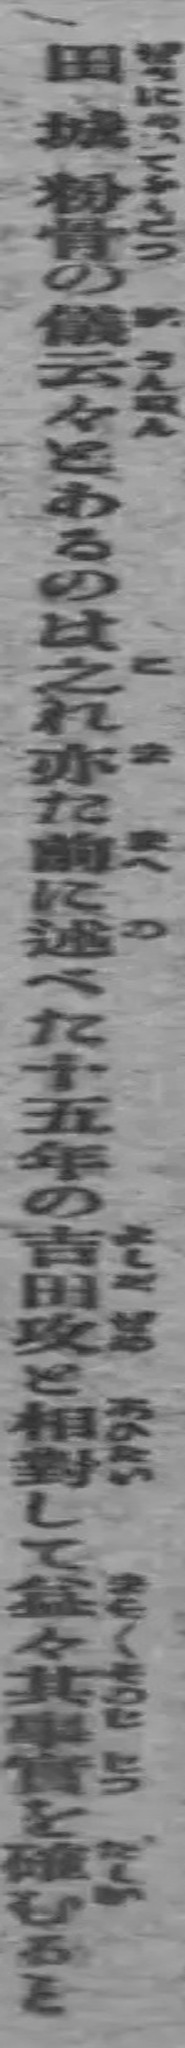田城粉骨の儀云々とあるのは之れ亦た前に述べた十五年の吉田攻と相対して益々其事実を確むること
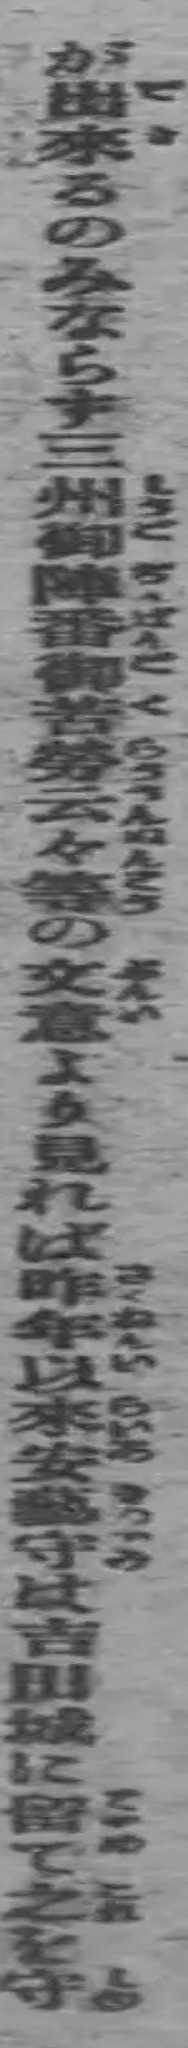が出来るのみならず三州御陣な番御苦労云々等の文意より見れば昨年以来安芸守は吉田城に留て之を守
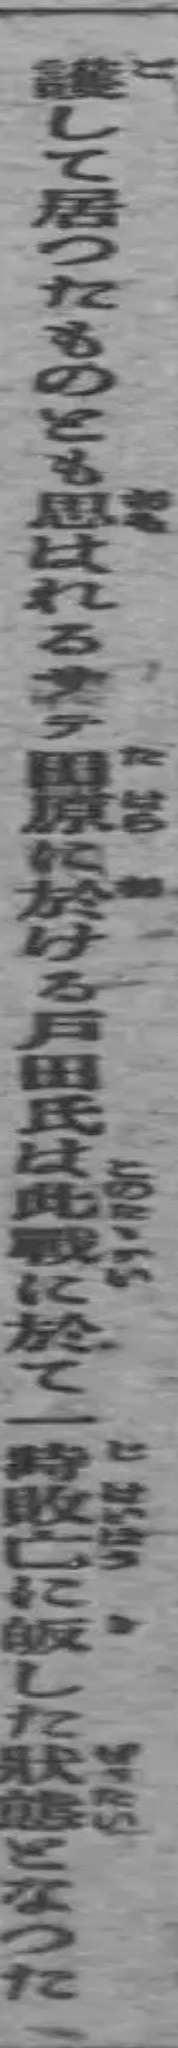護して居つたものとも思はれるさサテ田原に於ける戸田氏は此戦に於て一時敗亡に皈した状態となつた
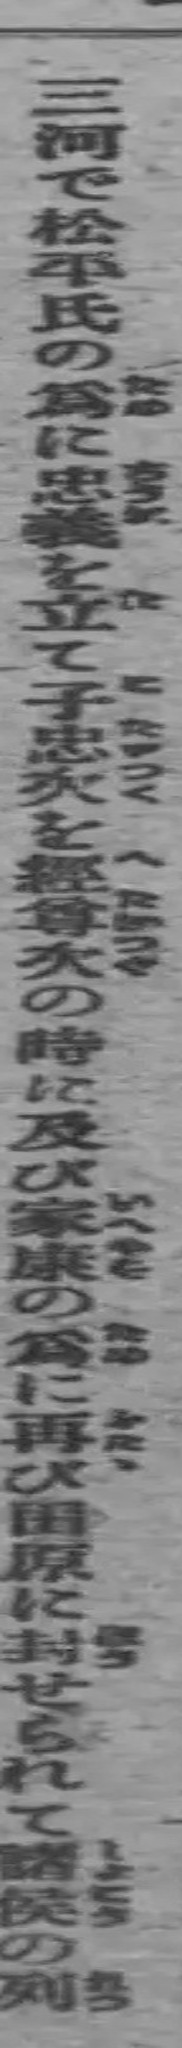三河で松平氏の為に忠義を立て子忠次を経尊次の時に及び家康の為に再び田原に封せられて諸侯の列
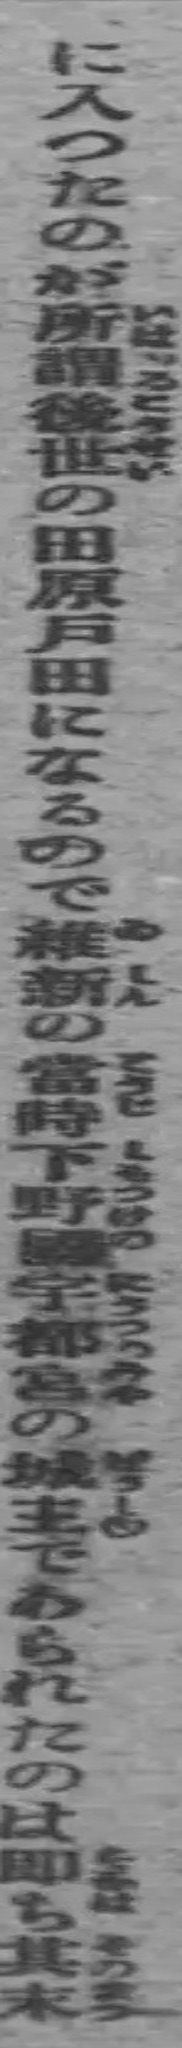に入つたのが所謂後世の田原戸田になるので維新の当時下野国宇都宮の城主であられたのは即ち其末
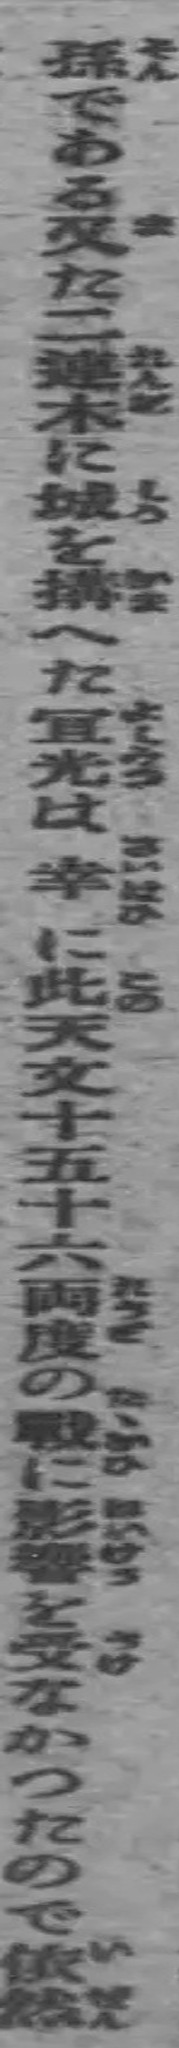孫である又た二連木に城を搆へた冝光は幸に此天文十五十六両度の戦に影響を受なかつたので依然
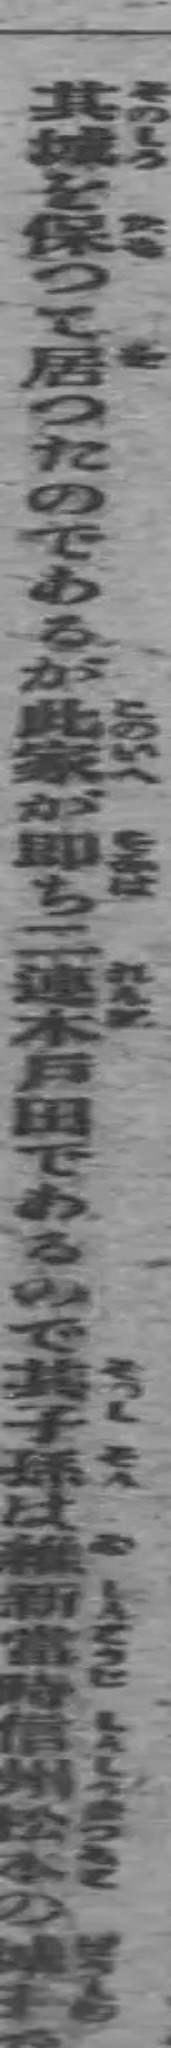其城を保つて居つたのであるが此家が即ち二連木戸田であるので其子孫は維新当時信州松本の城主で
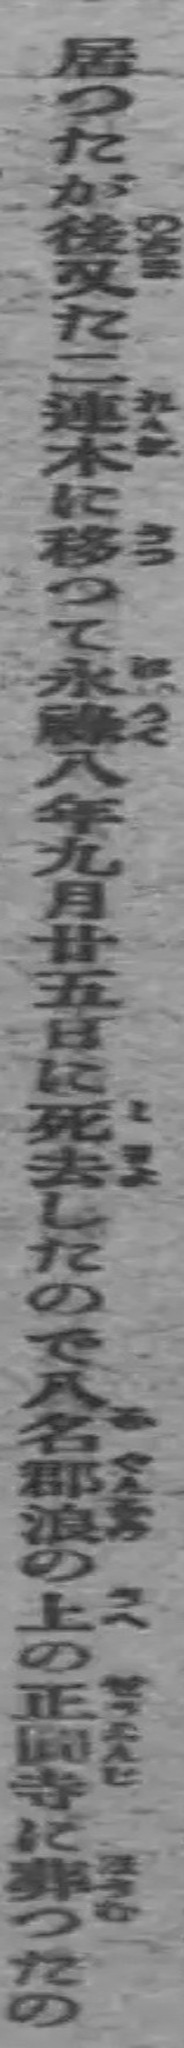浪の上戸田居つたが後又た二連木に移つて永禄八年九月廿五日に死去したので八名郡浪の上の正円寺に葬つたの
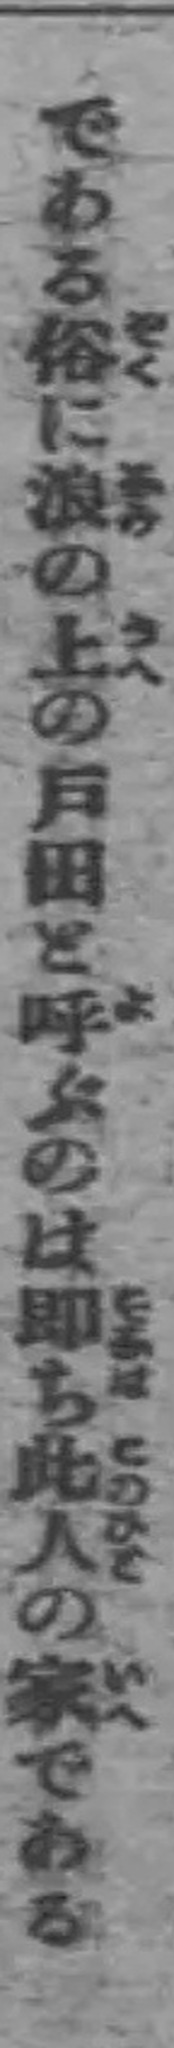である俗に浪の上の戸田と呼ぶのは即ち此人の家である
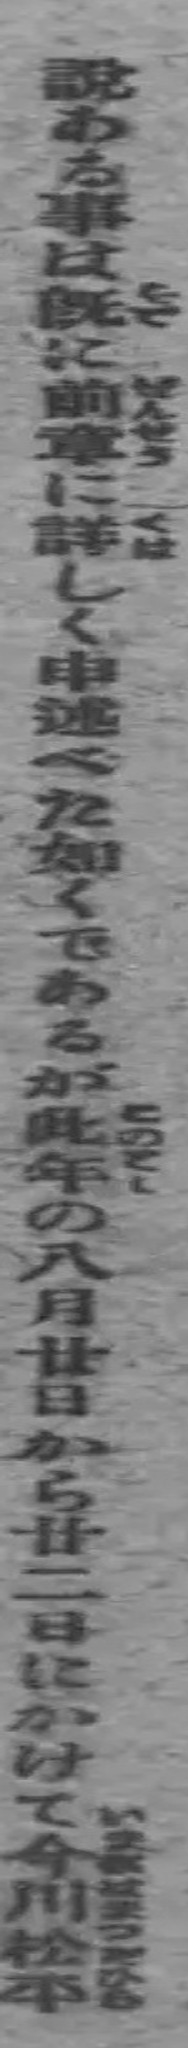説ある事は既に前章に詳しく申述べた如くであるが此年の八月廿日から廿二日にかけて今川松平
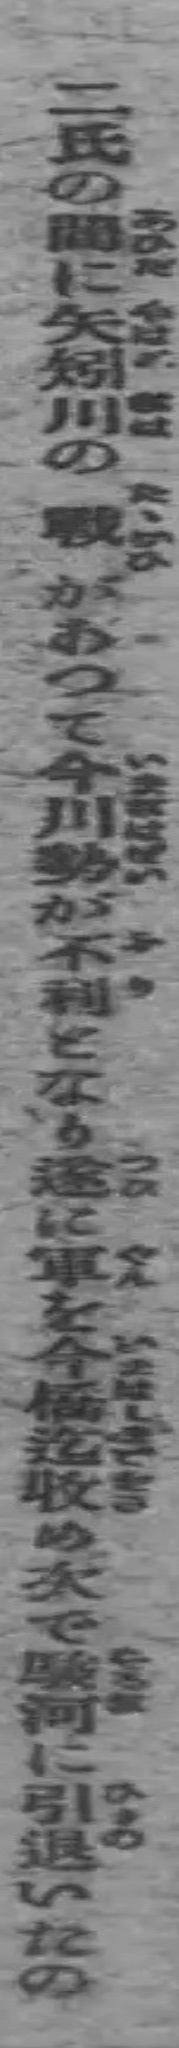二氏の間に矢矧川の戦があつて今川勢が不利となり遂に軍を今橋迄収め次で駿河に引退いたの
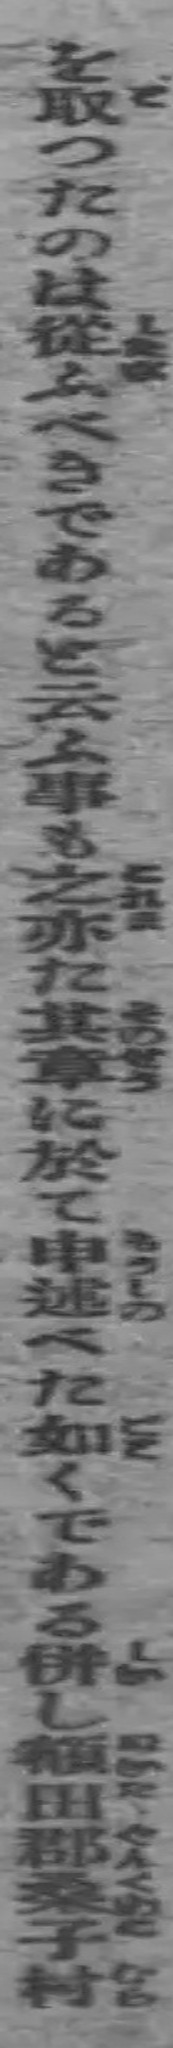を取つたのは従ふべきであると云ふ事も之亦た其章に於て申述べた如くである併し額田郡桑子村
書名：豊橋市史談
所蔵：国立国会図書館 National Diet Library, JAPAN
